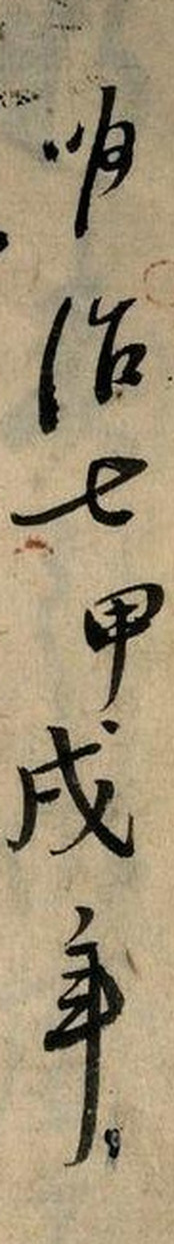明治七甲戌年

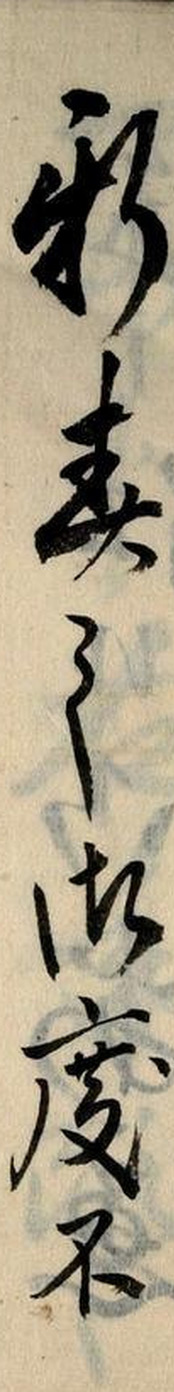新春之御慶不
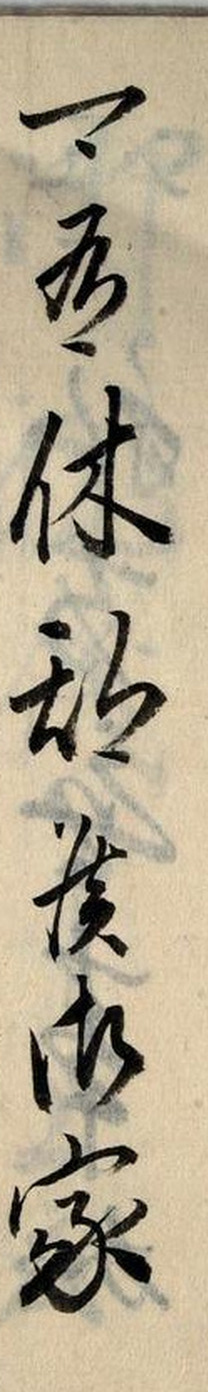可有休期候御家
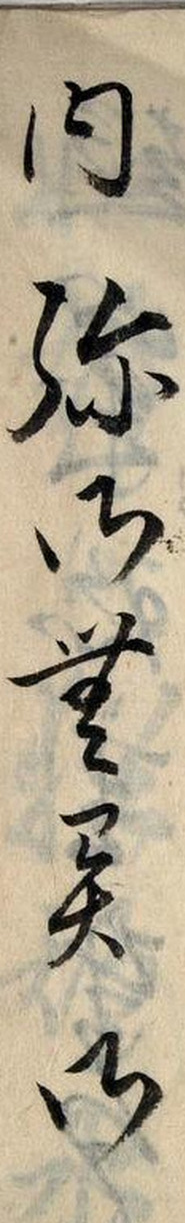内弥御無異御

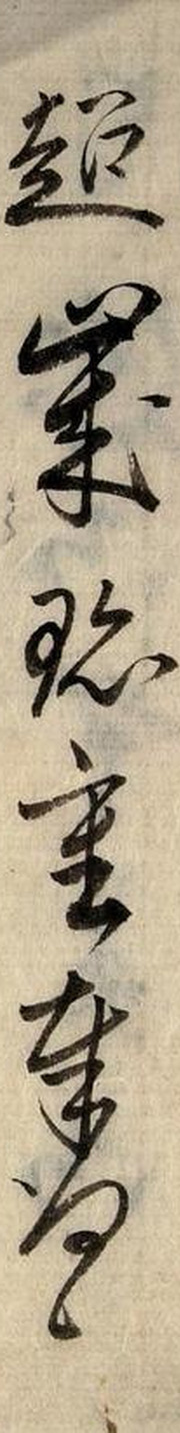超歳珍重奉存候
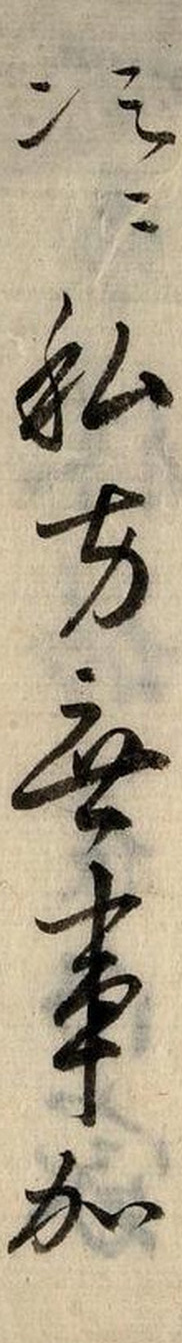次ニ私方無事加
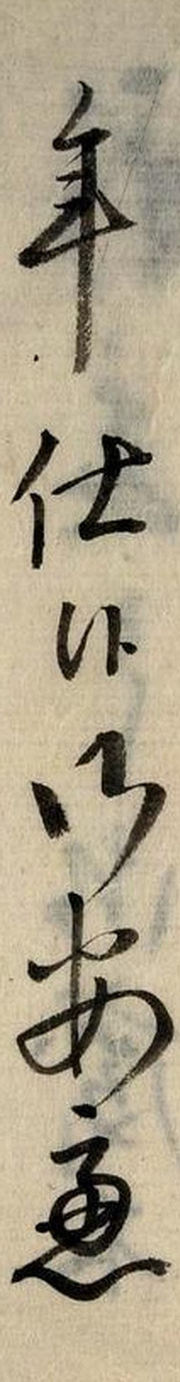年仕候御安慮
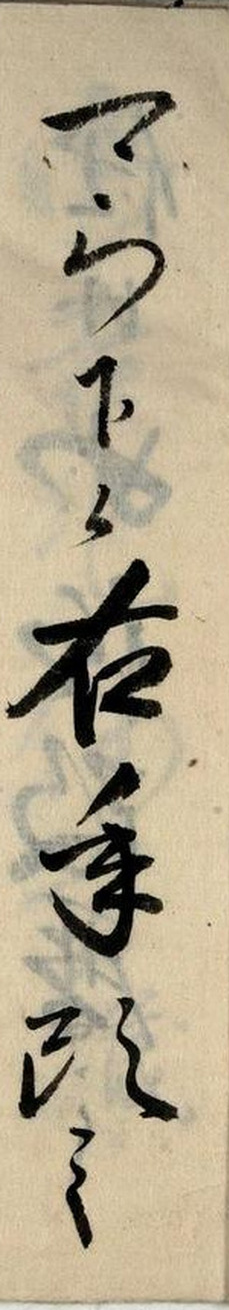可被下候右年頭之
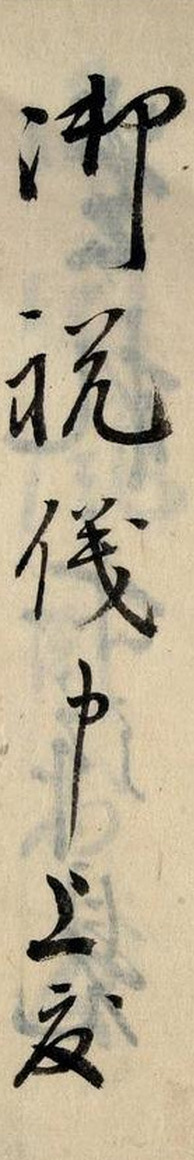御祝儀申上度
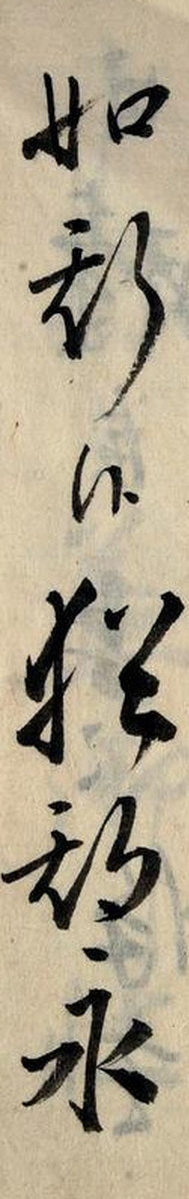如斯候猶期永

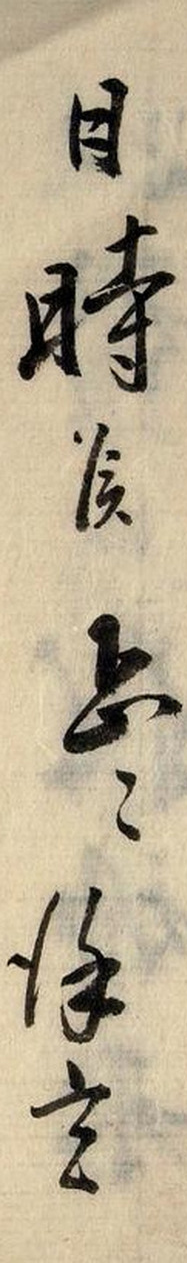日時候恐々謹言
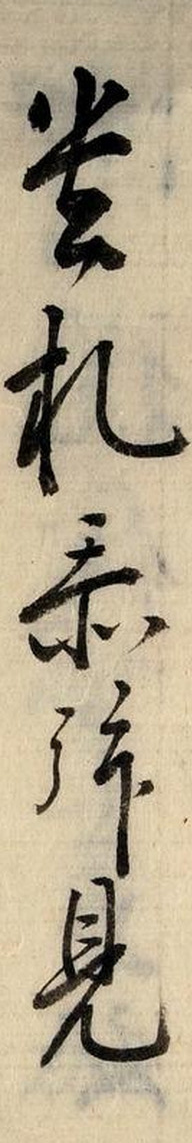貴札忝拝見
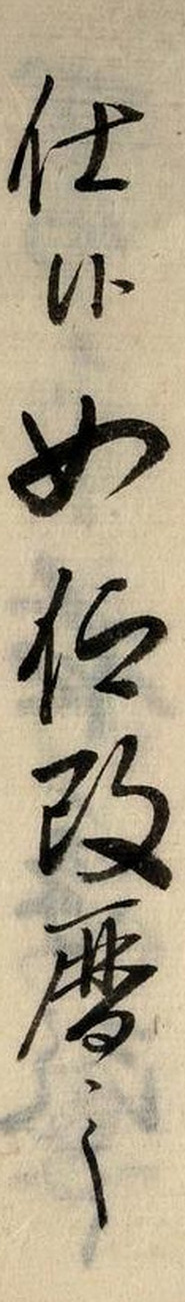仕候如仰改暦之
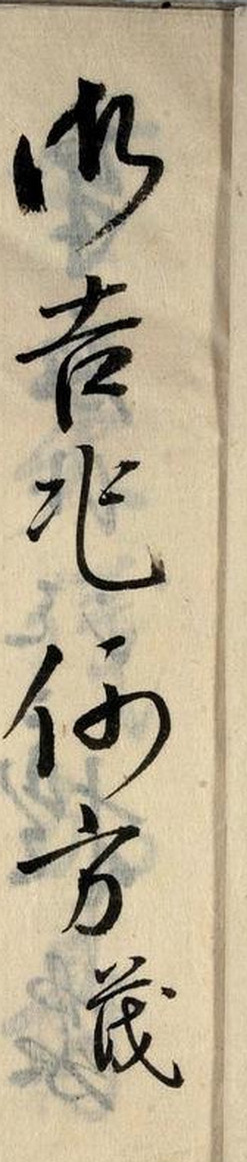御吉兆何方も
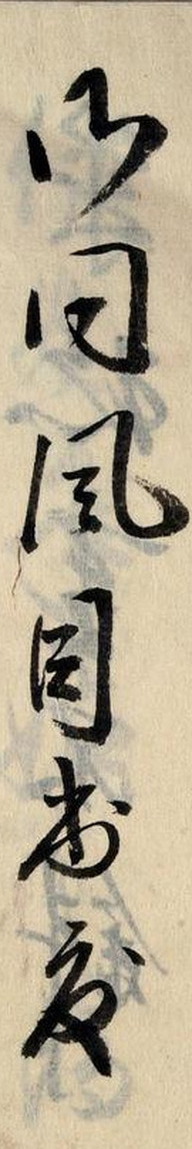御同風目出度
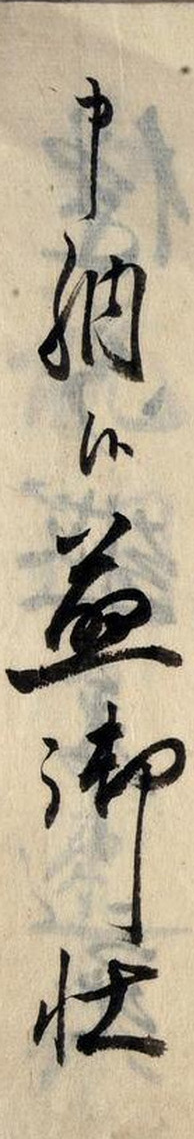申納候益御壮
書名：文章手本（手習）
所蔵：福井県文書館 Fukui Prefectural Archives
